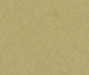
459 : 28= 16 11/28
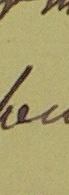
22
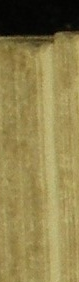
125
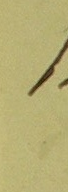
--
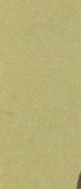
--
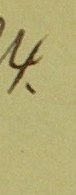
--
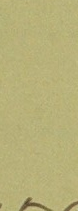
--
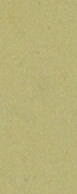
--
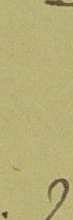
--
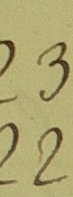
--
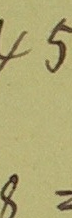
--
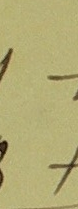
--
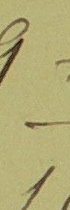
--
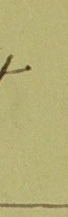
--
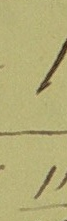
--
